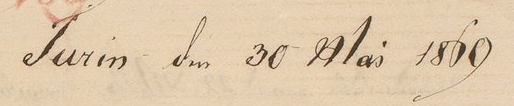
Turin den 30 Mai 1869
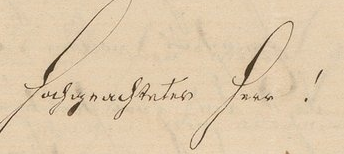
Hochgeachteter
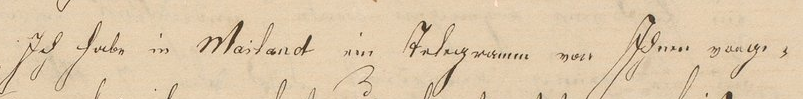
Ich habe in Mailand ein Telegramm von Ihnen vorge-
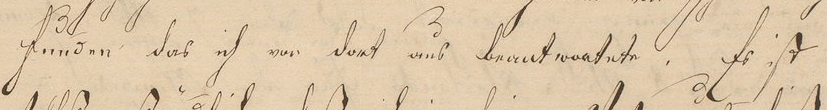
funden das ich von dort aus beantwortete. Es ist
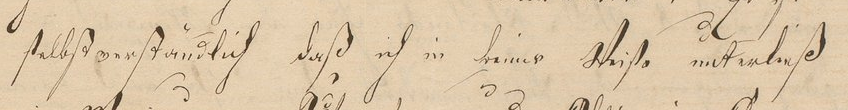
selbstverständlich daß ich in keiner Weise unterließ
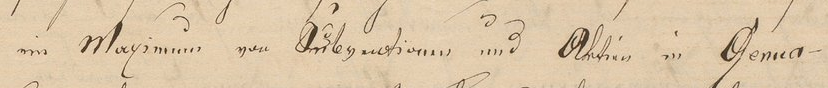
ein Maximum von Subventionen und Aktien in Genua
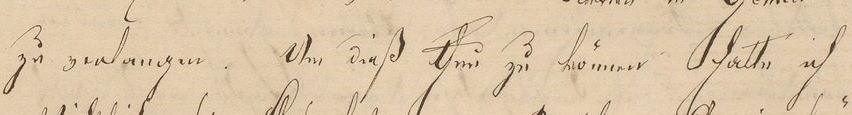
zu verlangen. Um dieß thun zu können hatte ich
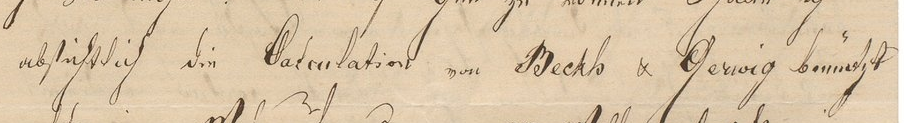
absichtlich die Calculation von Beckh & Gerwig benützt
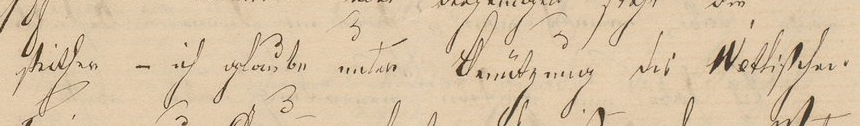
seither – ich glaube unter Benützung des Wetlischen
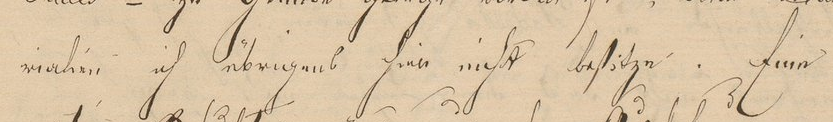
rialien ich übrigens hier nicht besitze. Eine
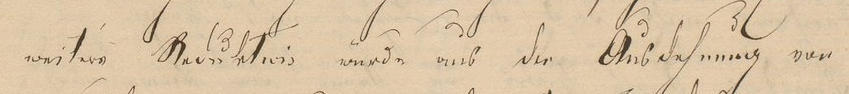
weitere Reduktion würde aus der Ausdehnung von
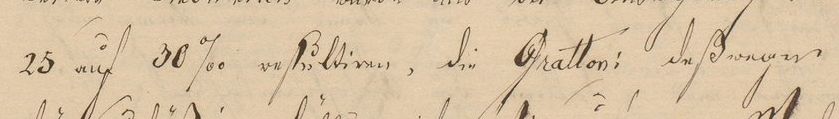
25 auf 30‰ resultiren, die Grattoni deßwegen
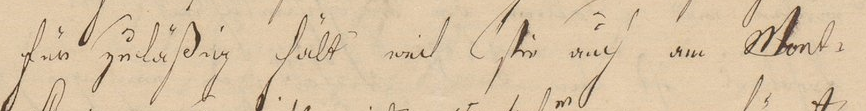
für zuläßig hält weil sie auch am Mont-
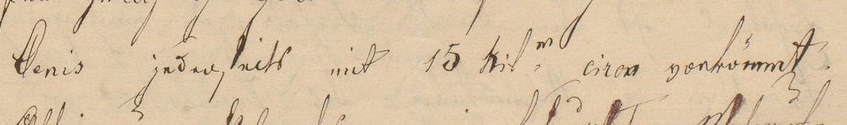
Cenis jederseits mit 15 Kilm circa vorkömmt.
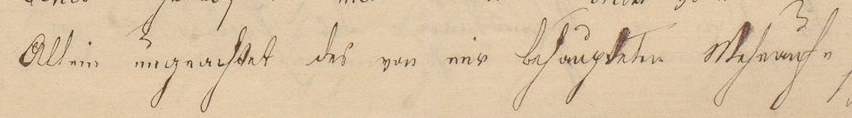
Allein ungeachtet des von mir behauptete Mehrauf-
